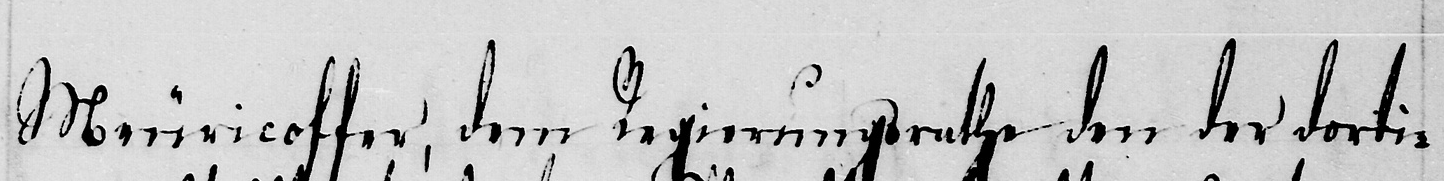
Meuricoffer, dem Regierungsrathe den der dorti¬
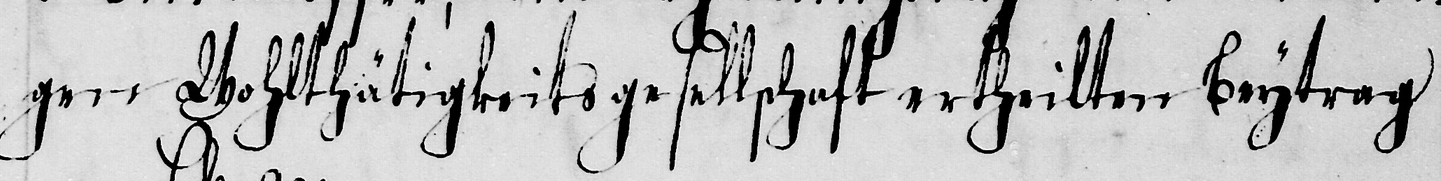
gen Wohlthätigkeitsgesellschaft ertheilten Beytrag
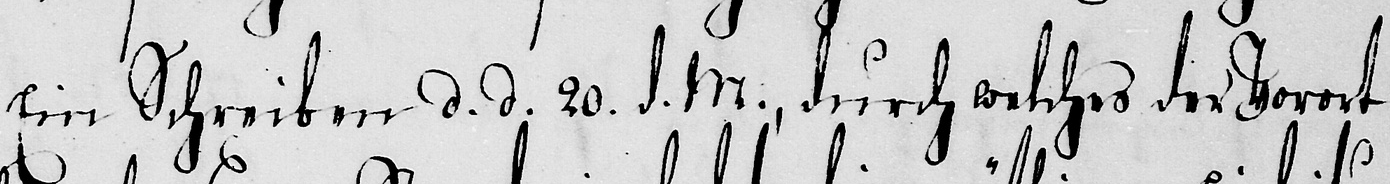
Ein Schreiben d.d. 20. d. M., durch welches der Vorort
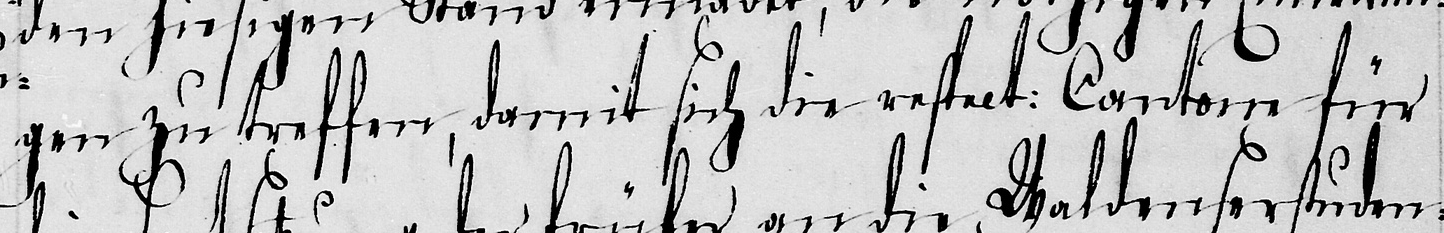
gen zu treffen, damit sich die respect: Cantone für
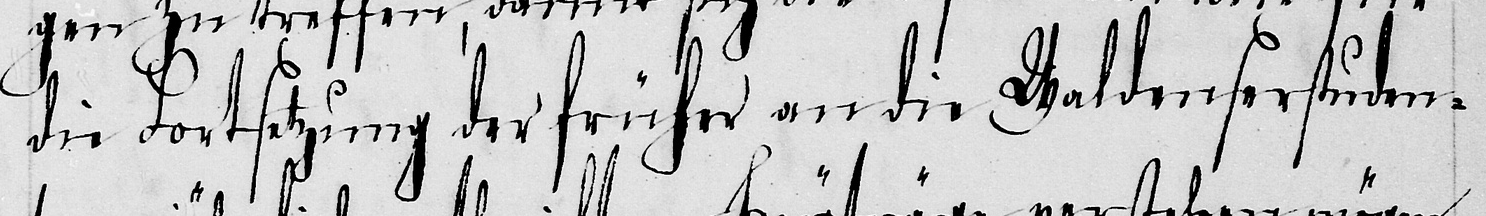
die Fortsetzung der früher an die Waldenserstuden¬
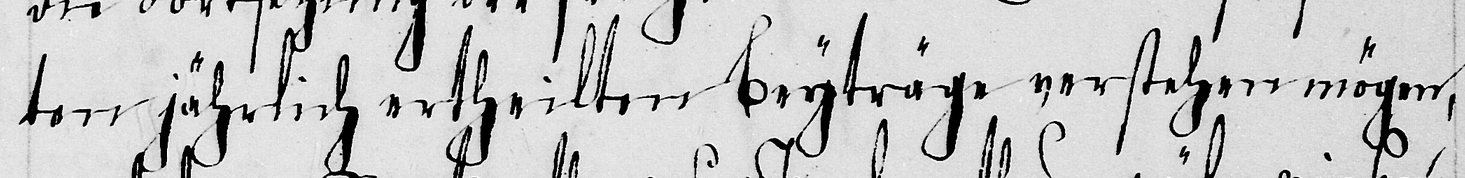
ten jährlich ertheilten Beyträge verstehen mögen,
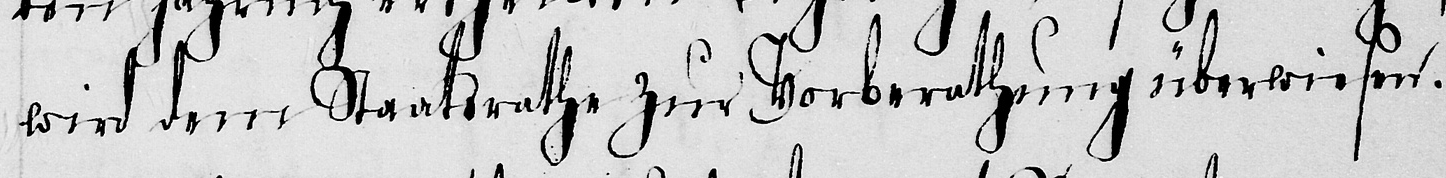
wird dem Staatsrathe zur Vorberathung überwiesen.
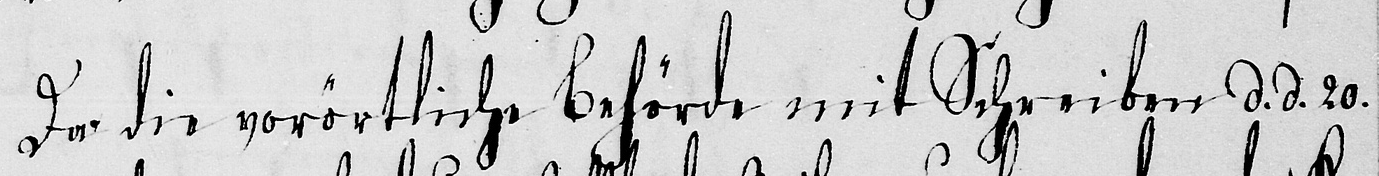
Da die vorörtliche Behörde mit Schreiben d.d. 20.
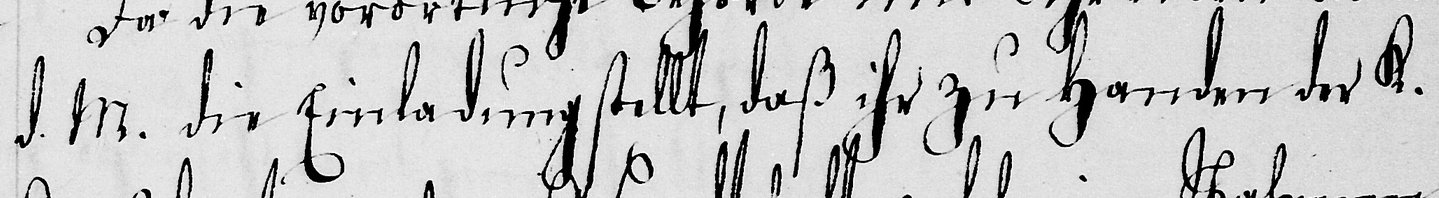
d. M. die Einladung stellt, daß ihr zu Handen der K.
